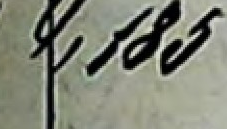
0,185
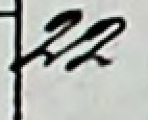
22
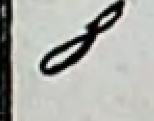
8
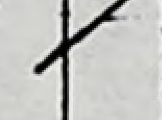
7
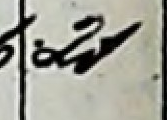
21
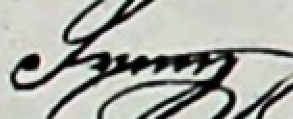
Franz
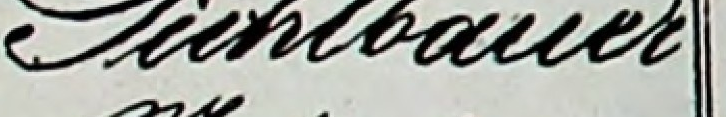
Pichlbauer
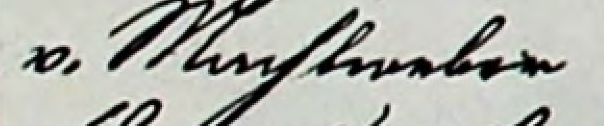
v. Machtweber
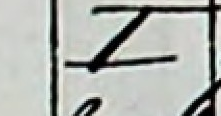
I
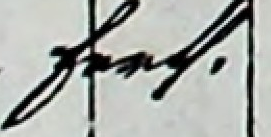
Forts.
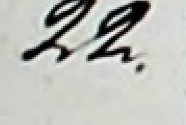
22
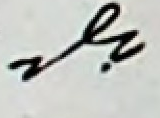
do
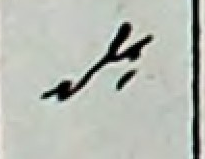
do
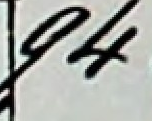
94
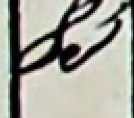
85
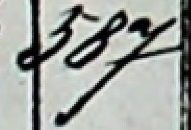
587
